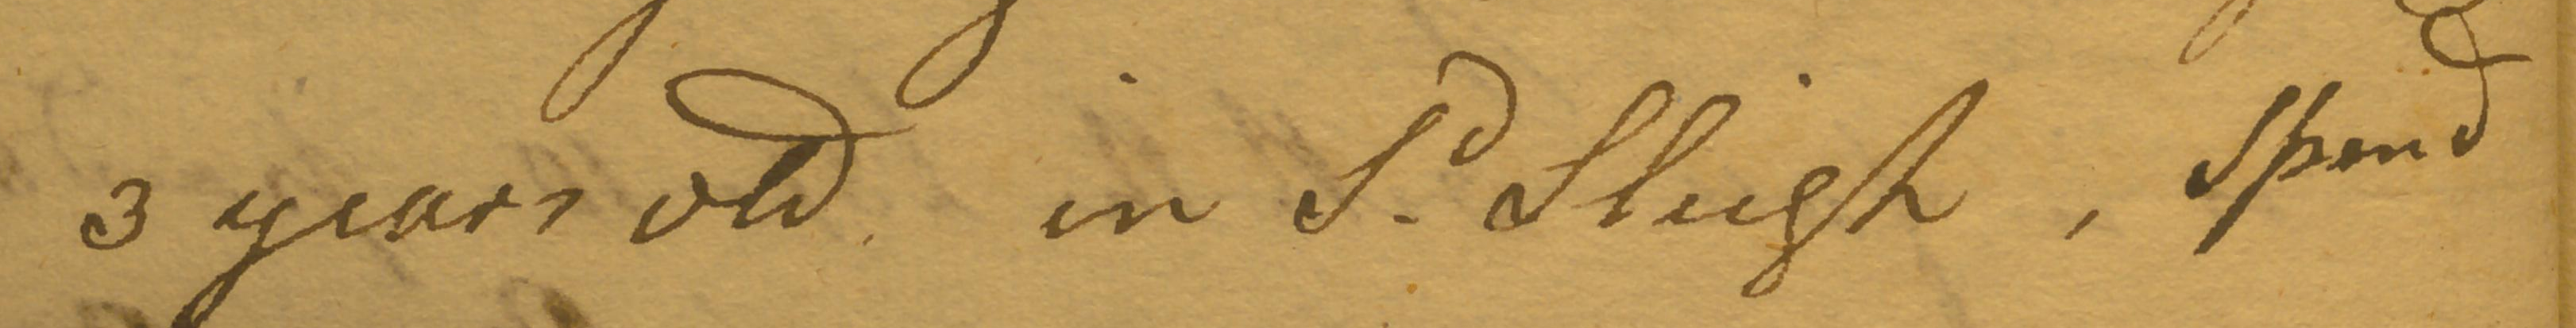3 years old, in S^d. Sleigh, spend
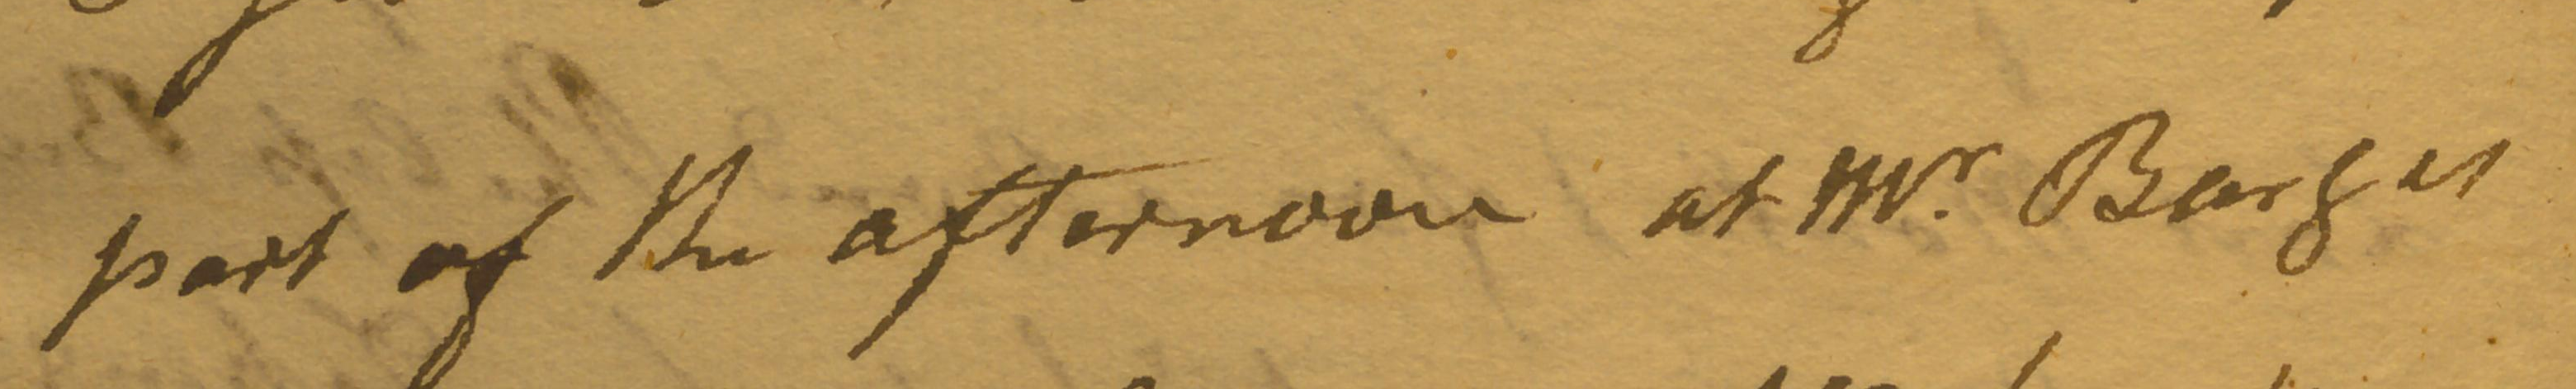part of the afternoon at M^r. Barges
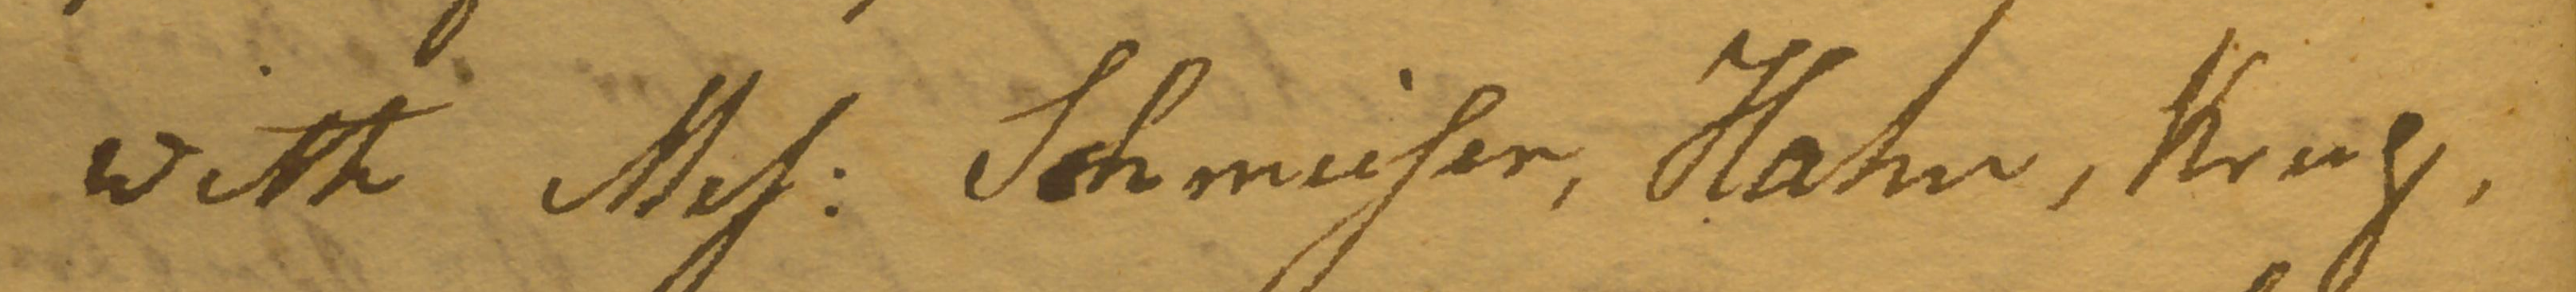with Mes: Schmeiser, Hahn, Krug,
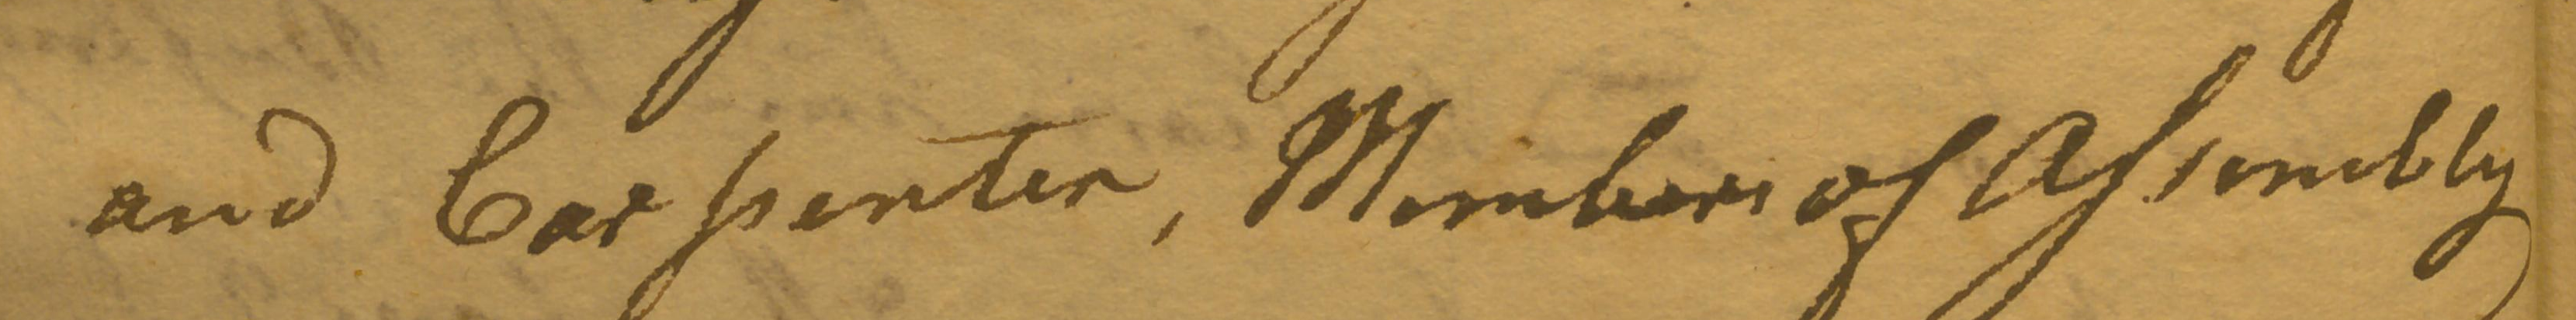and Carpenter, Members of Assembly
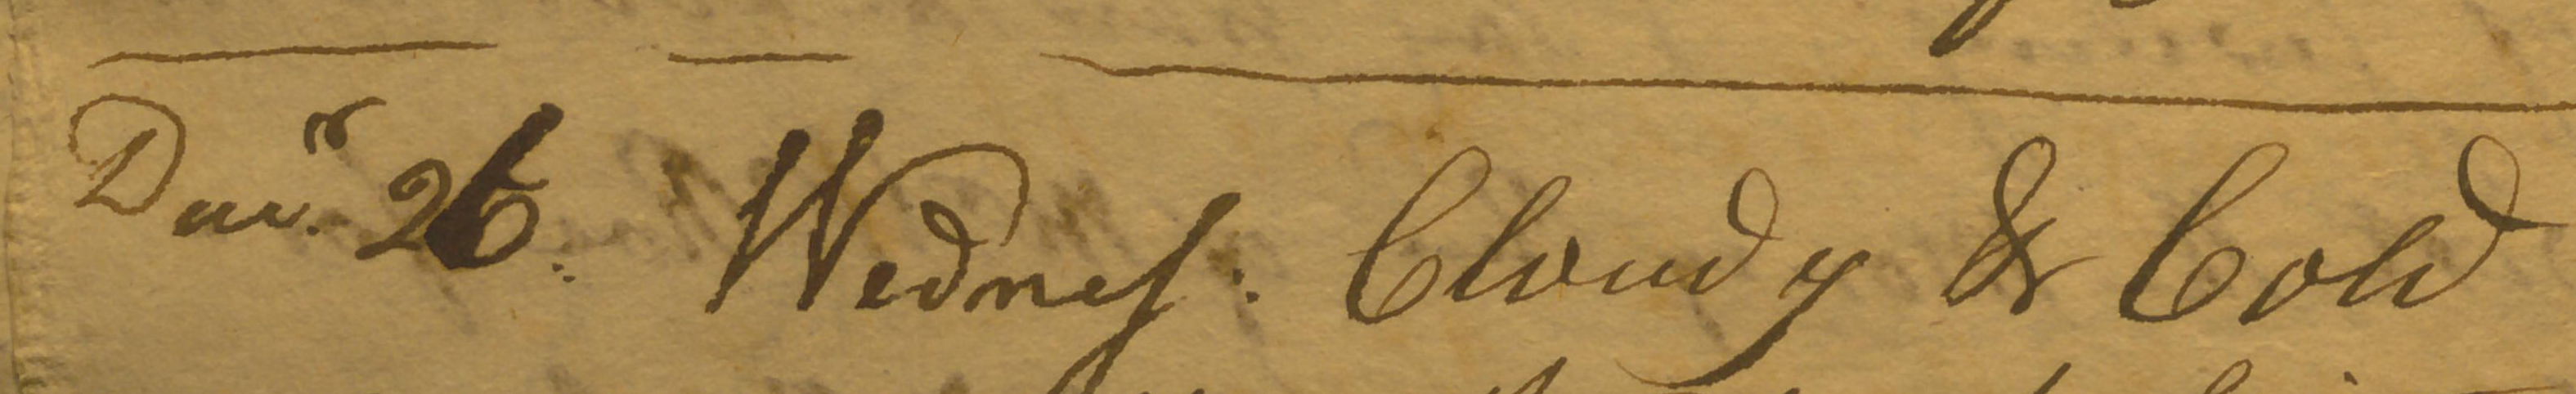Dec^r. 26. Wednes. Cloudy & Cold
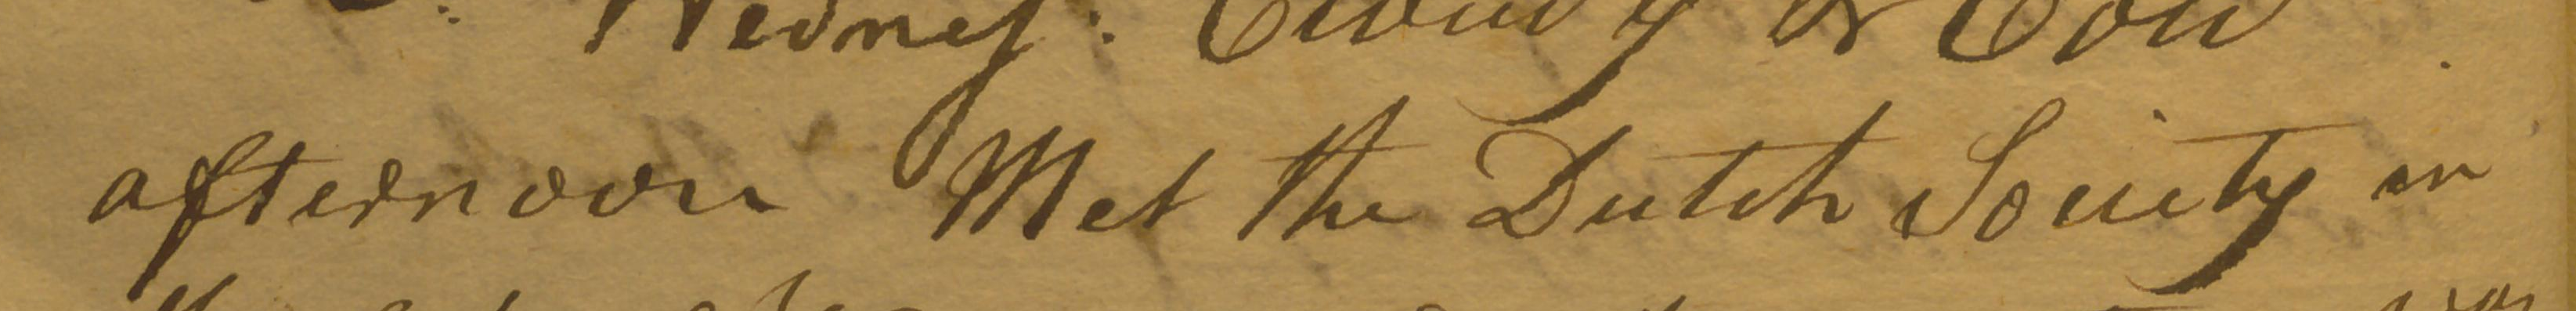afternoon Met the Dutch Society in
